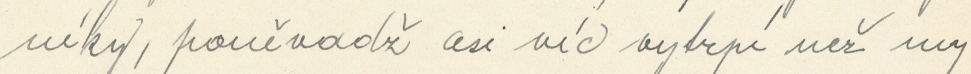níky, poněvadž asi víc vytrpí než my
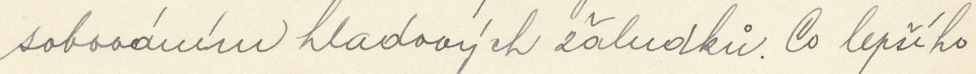sobováním hladových žaludků. Co lepšího
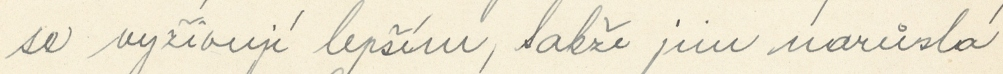se vyživují lepším, takže jim narůstá
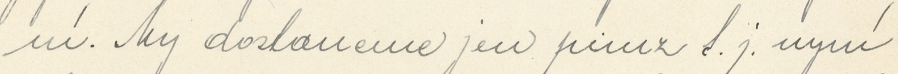ní. My dostaneme jen pimz t. j. nyní
